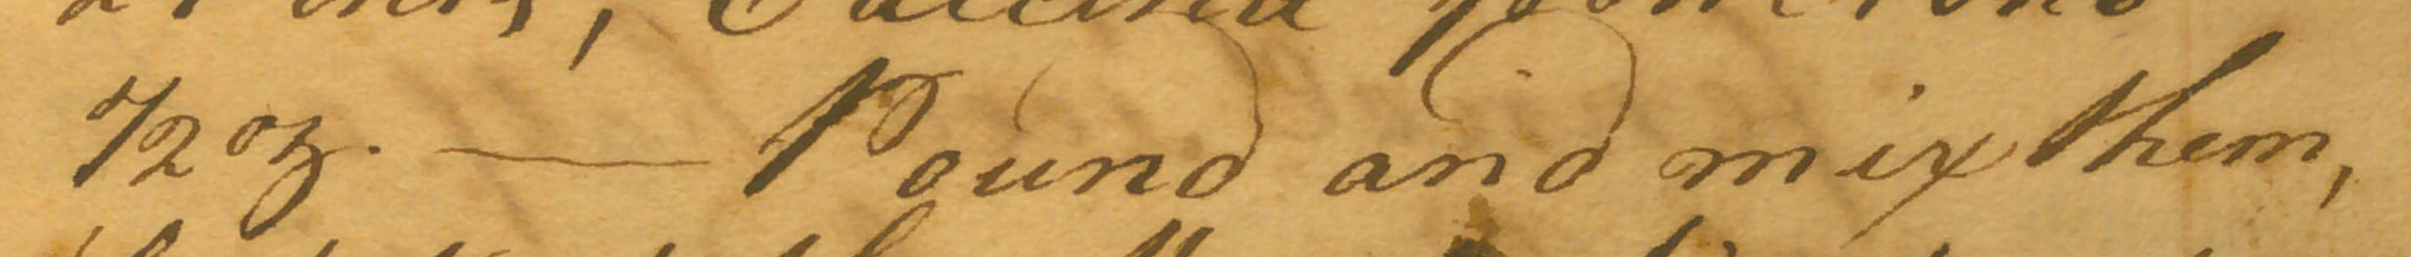1/2 oz.- Pound and mix them,
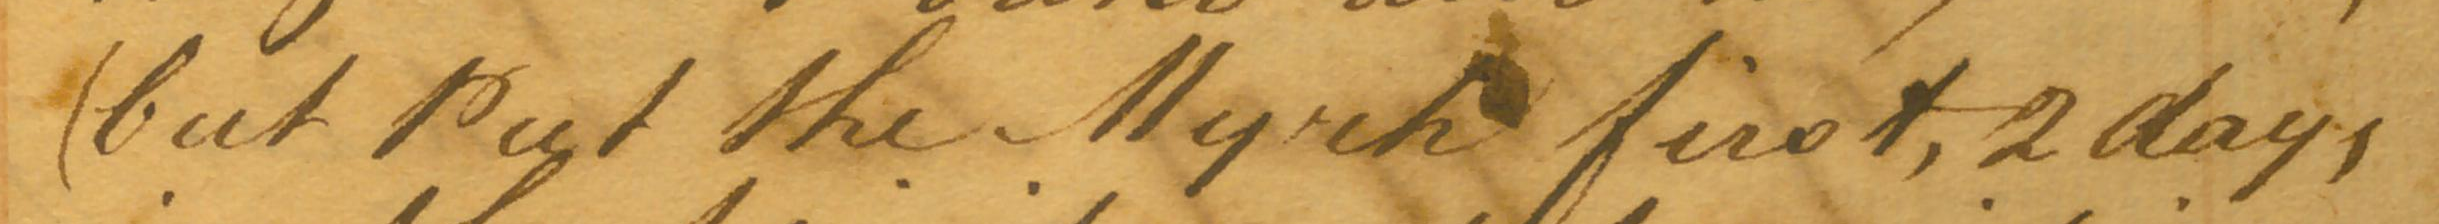(but Put the Myrh first, 2 days
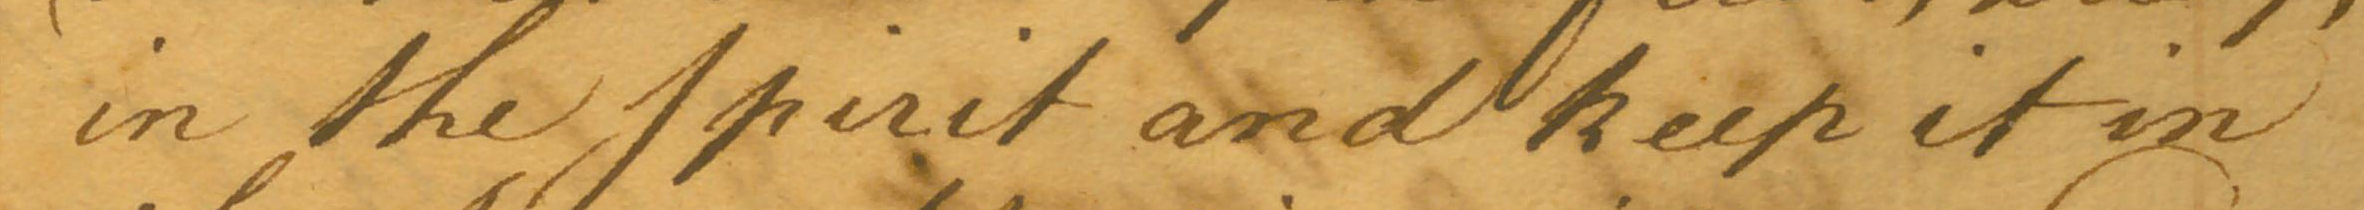in the spirit and keep it in
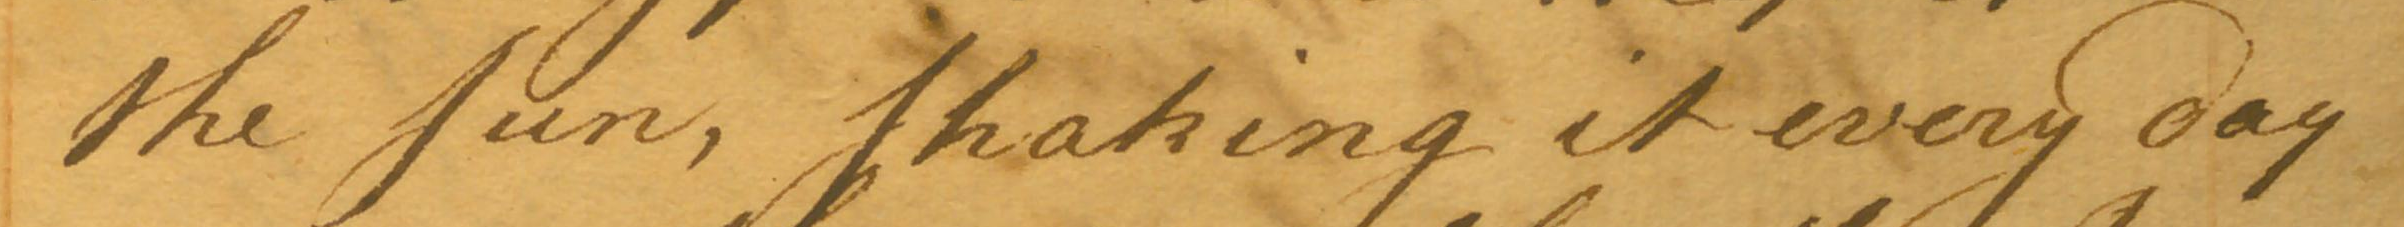the sun, shaking it every day
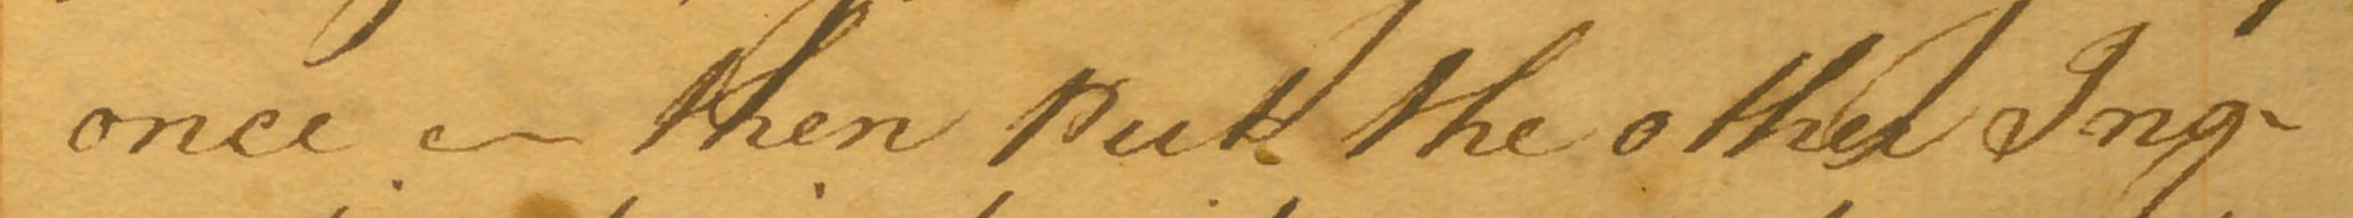once- then put the other Ing-
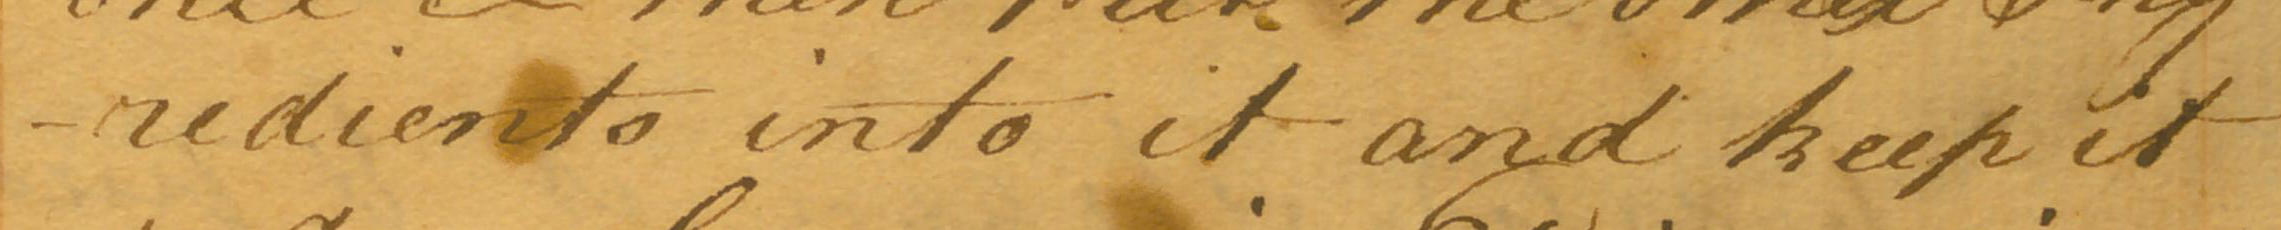-redients into it and keep it
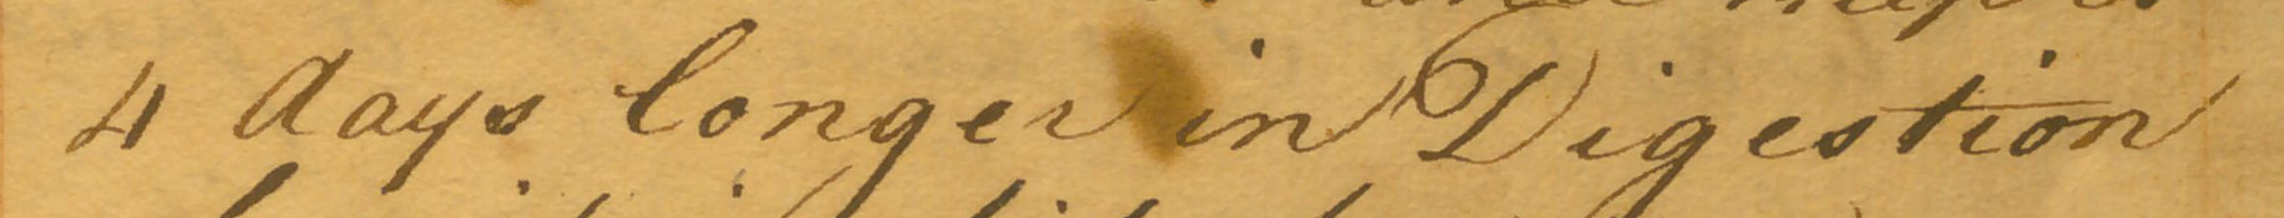4 days longer in Digestion
